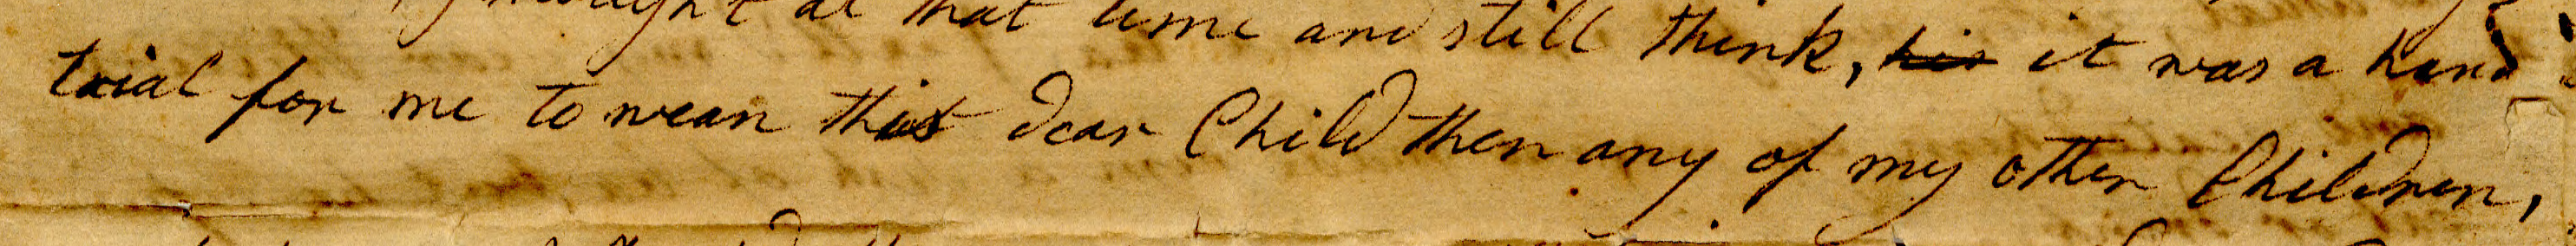trial for me to wean this dear Child then any of my other Children,
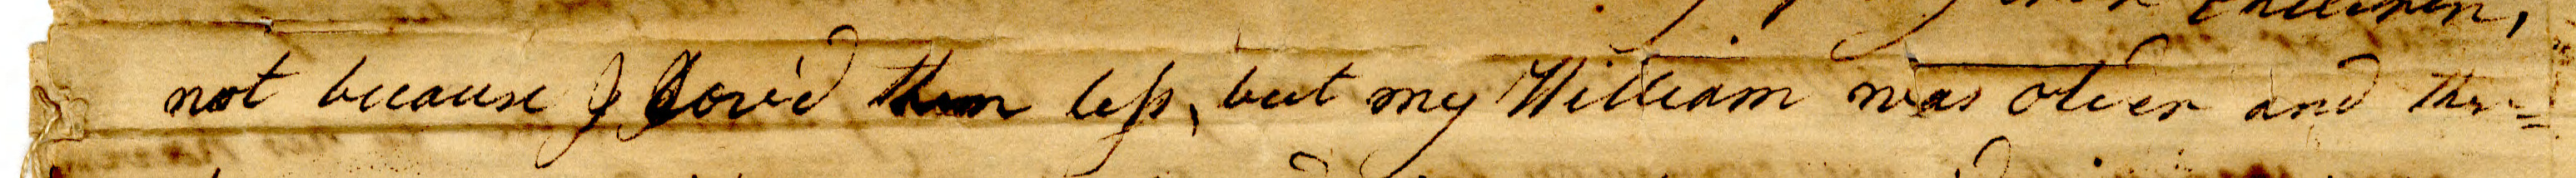not because I lov'd them less, but my William was older and there-
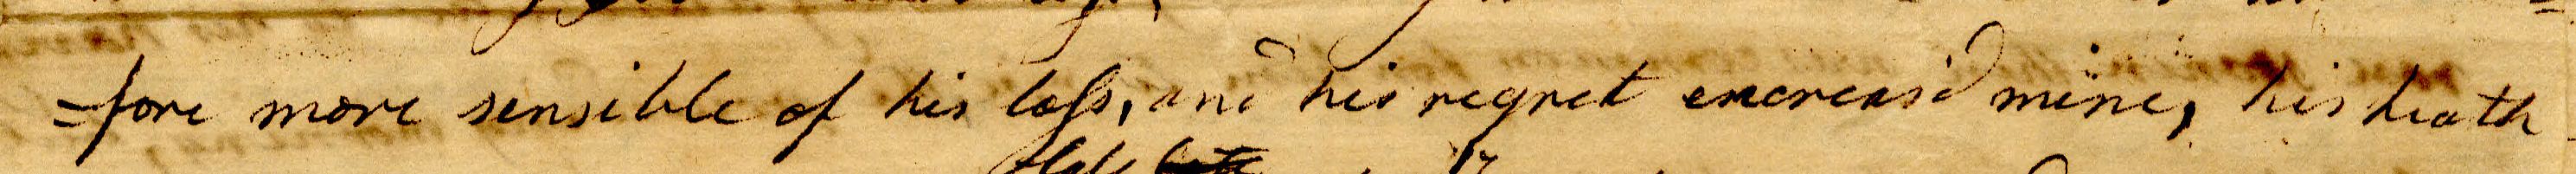-fore more sensible of his loss, and his regret encreased mine, his heath
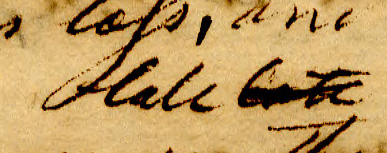late [late]
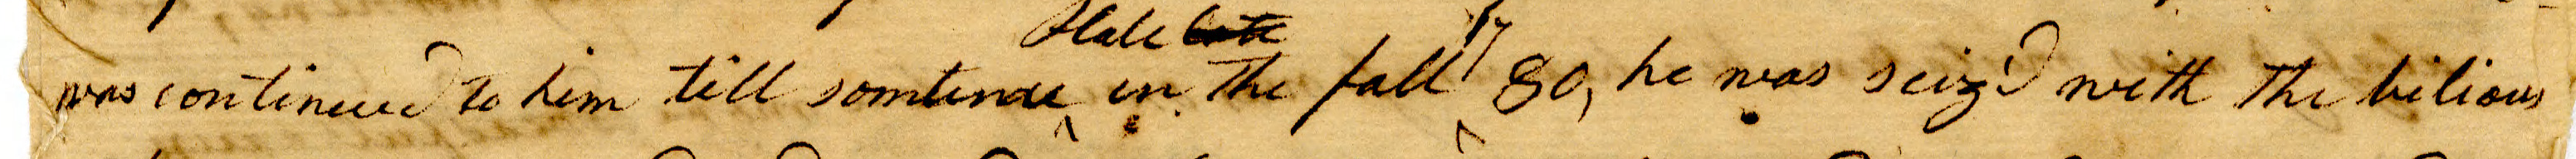was continued to him till sometime ^ in the fall ^17 80, he was seized with the bilious
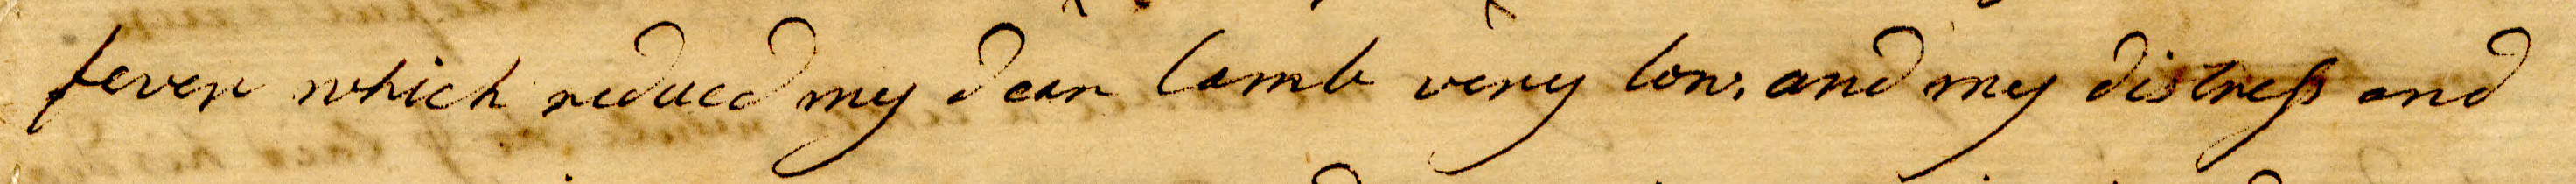fever which reducd my dear lamb very low, and my distress and
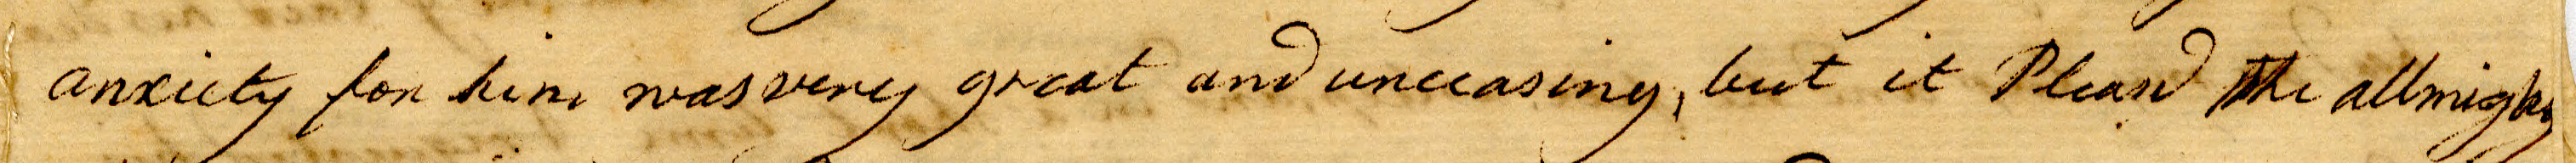anxiety for him was very great and unceasing, but it Pleasd the allmighty
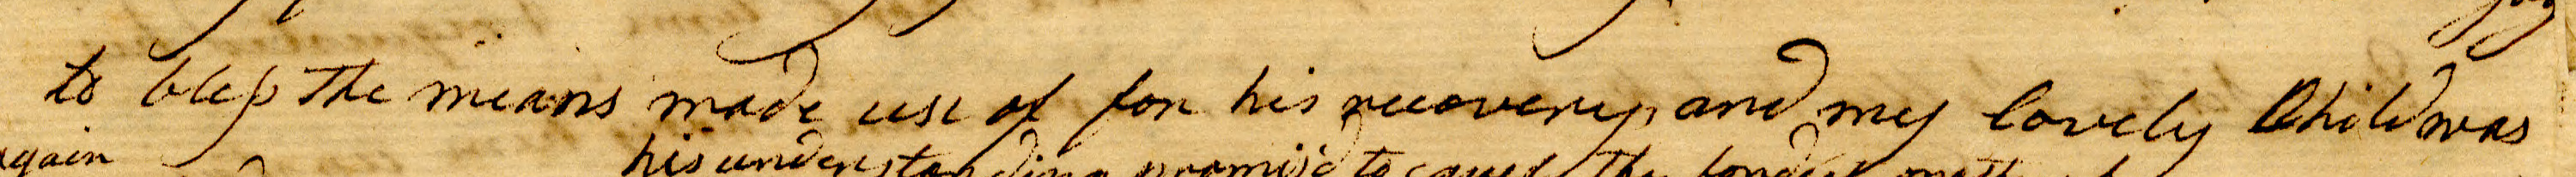to bless the means made use of for his recovery, and my lovely Child was
